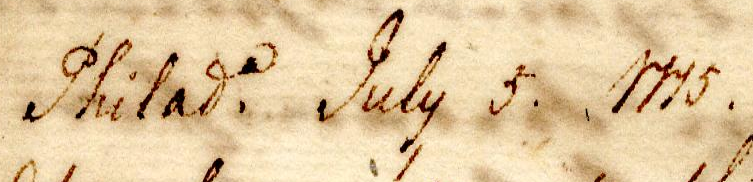Philad^a. July 5. 1775.
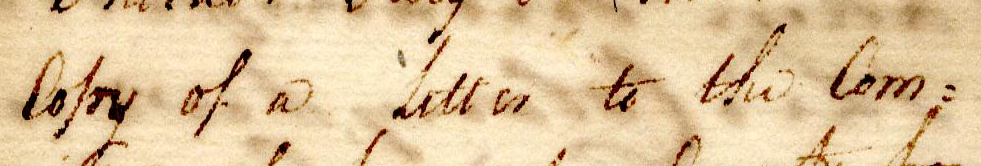Copy of a Letter to the Com-
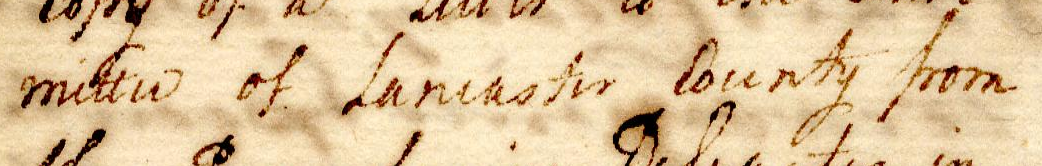-mittee of Lancaster County from
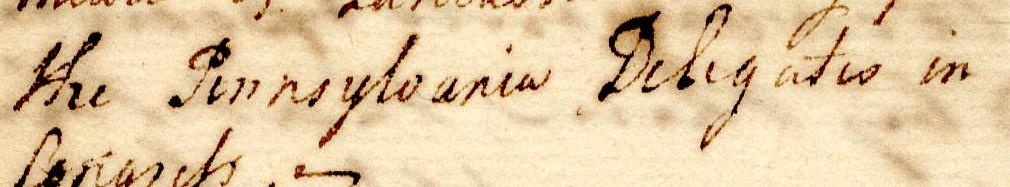the Pennsylvania Delegates in
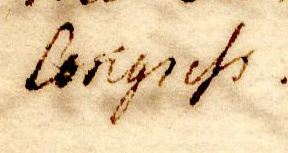Congress.
